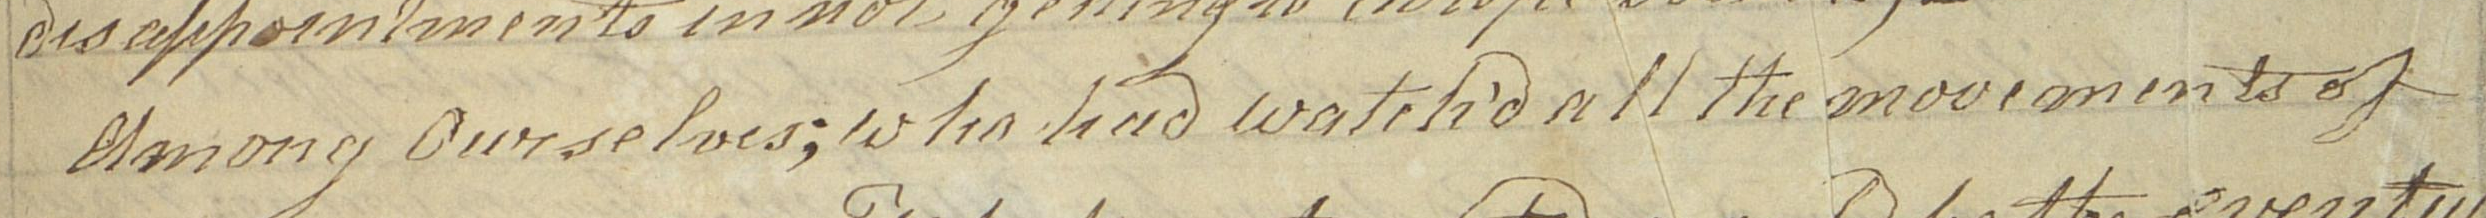Among Ourselves; who had watch'd all the movements of
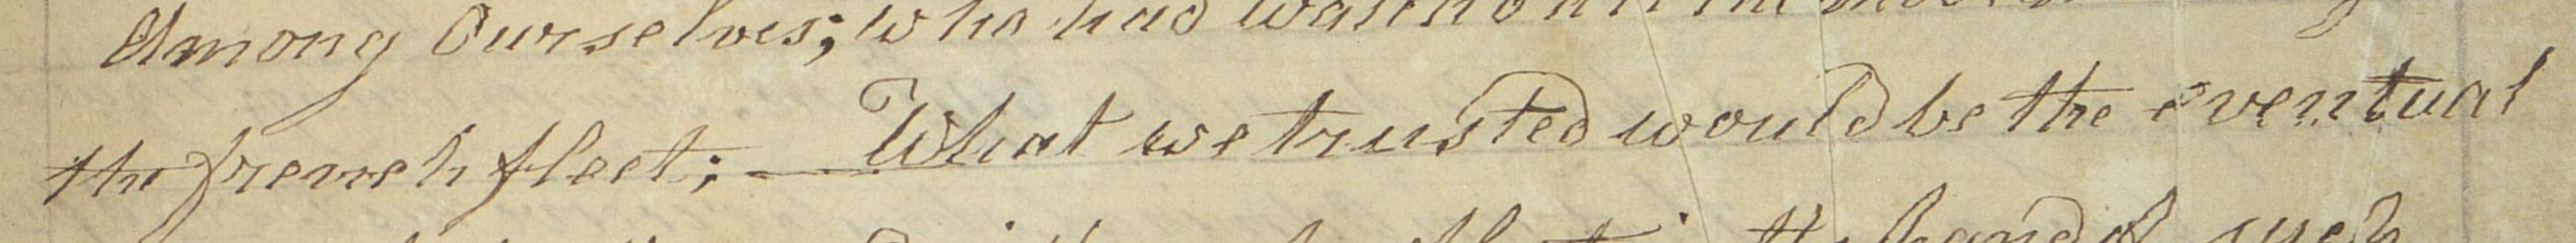the french fleet; What we trusted would be the eventual
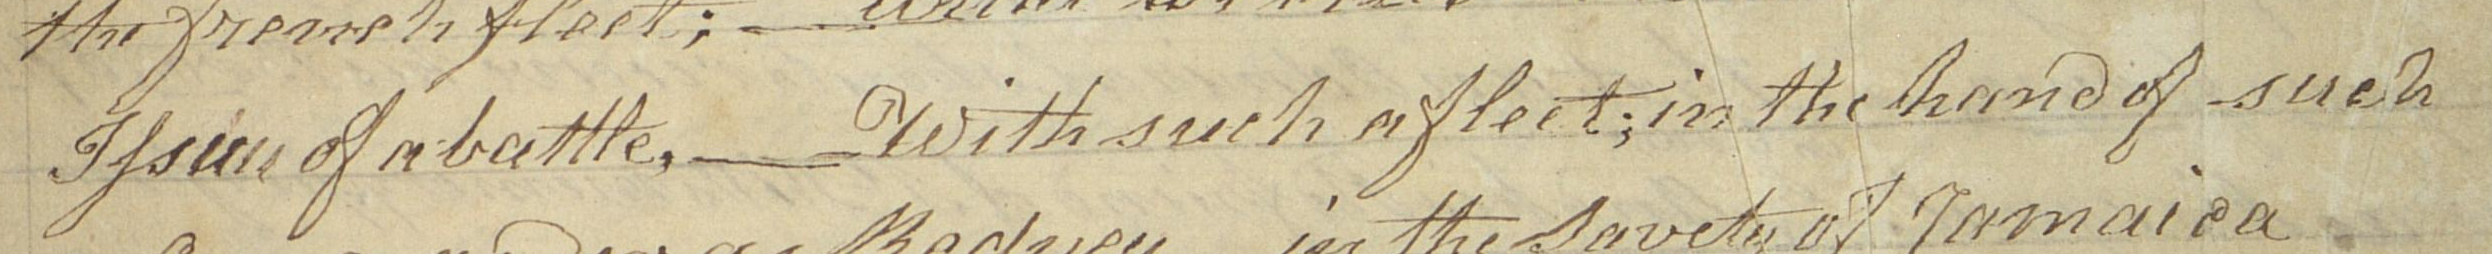Issue of a battle. With such a fleet; in the hand of such
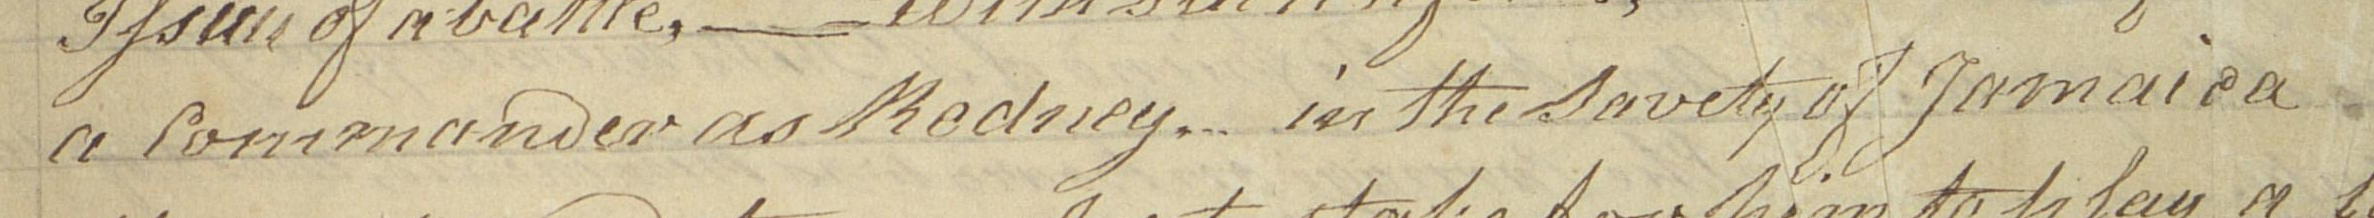a commander as Rodney. in the Savety of Jamaica
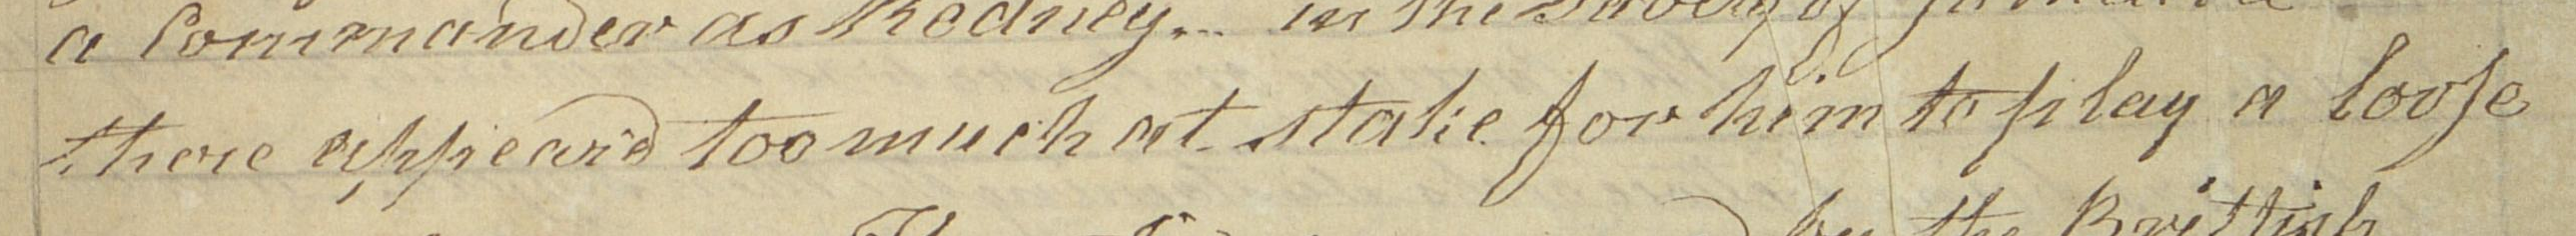there appear'd too much at stake for him to play a loose
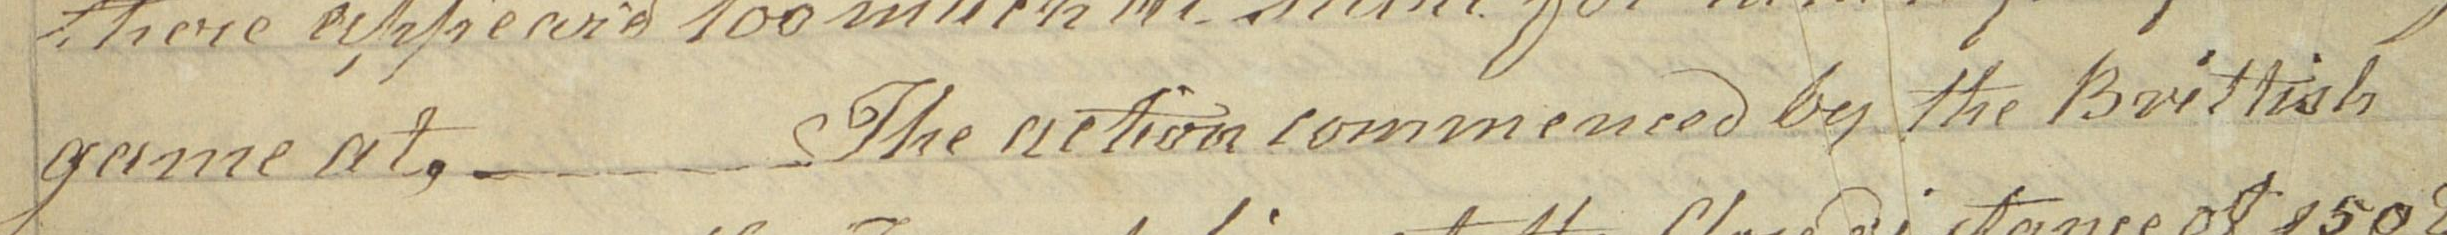game at, The action commenced by the Brittish
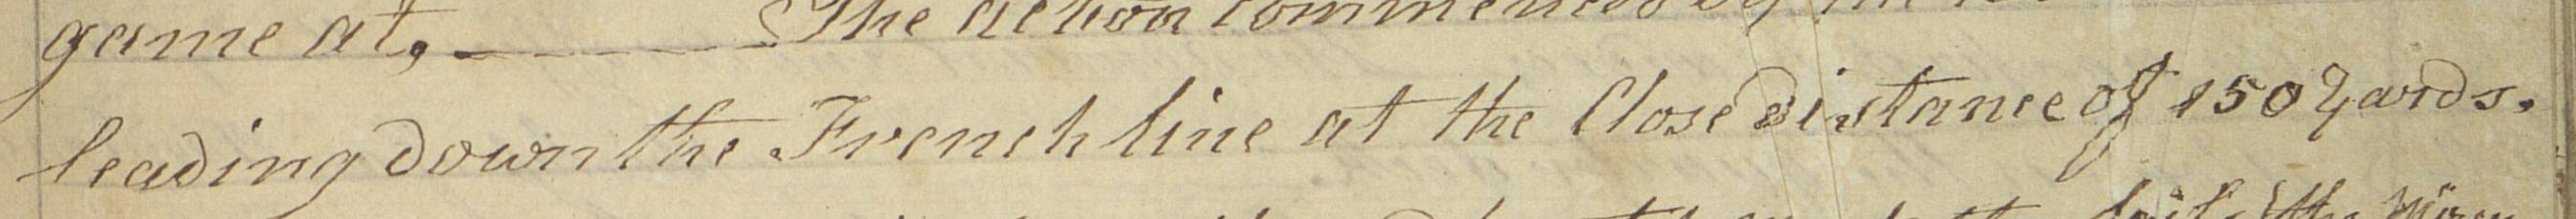leading down the French line at the Close distance of 150 yards.
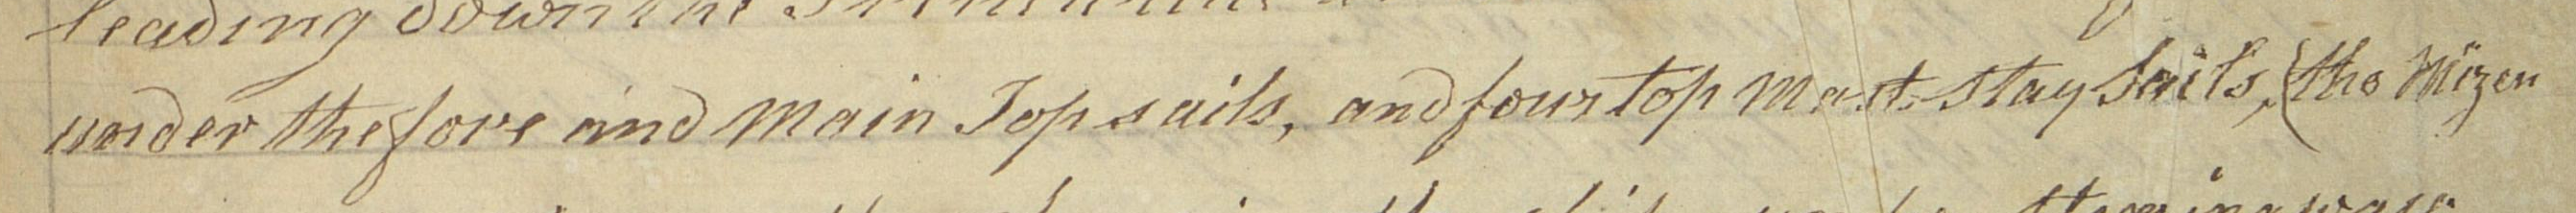under the fore and main Top sails, and four top mast stay Sails, (tho Mizen
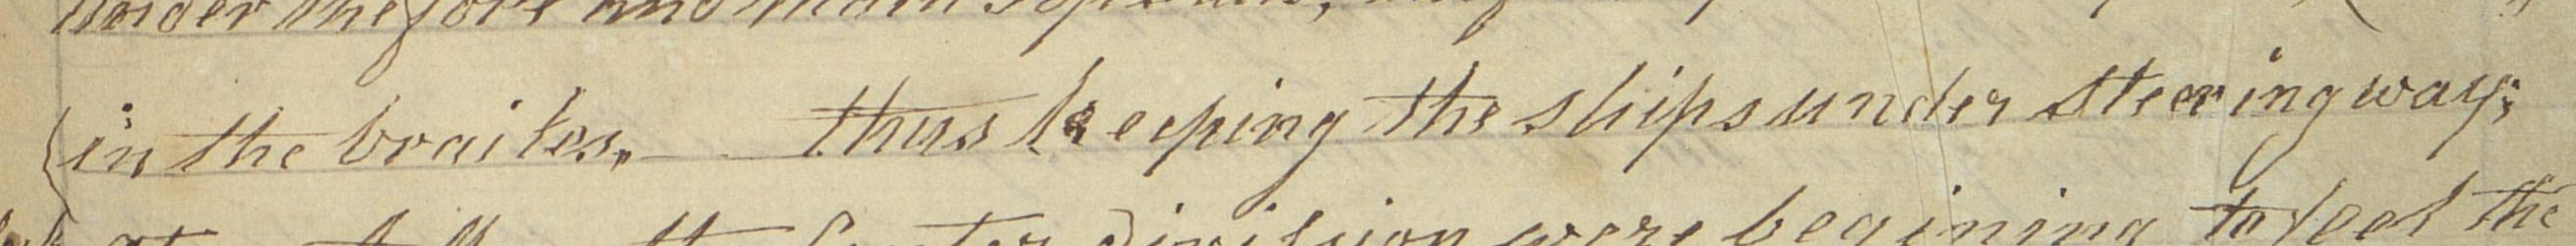(in the braites, thus keeping the ships under steering way;
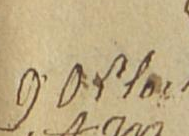9 Octob^r.
